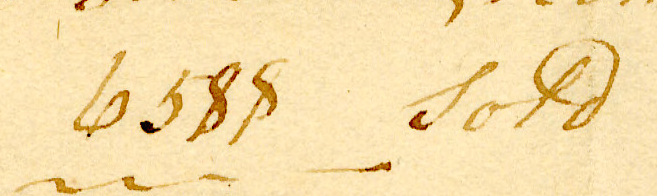6588 sold
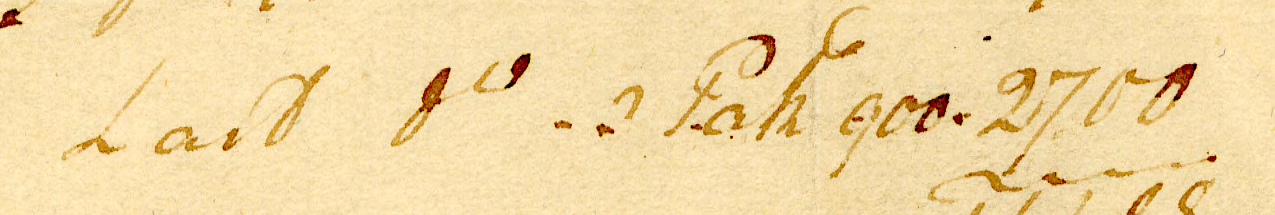Land j^u .. a Pak 900.2700
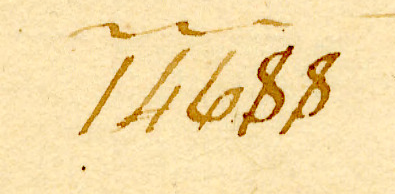14688
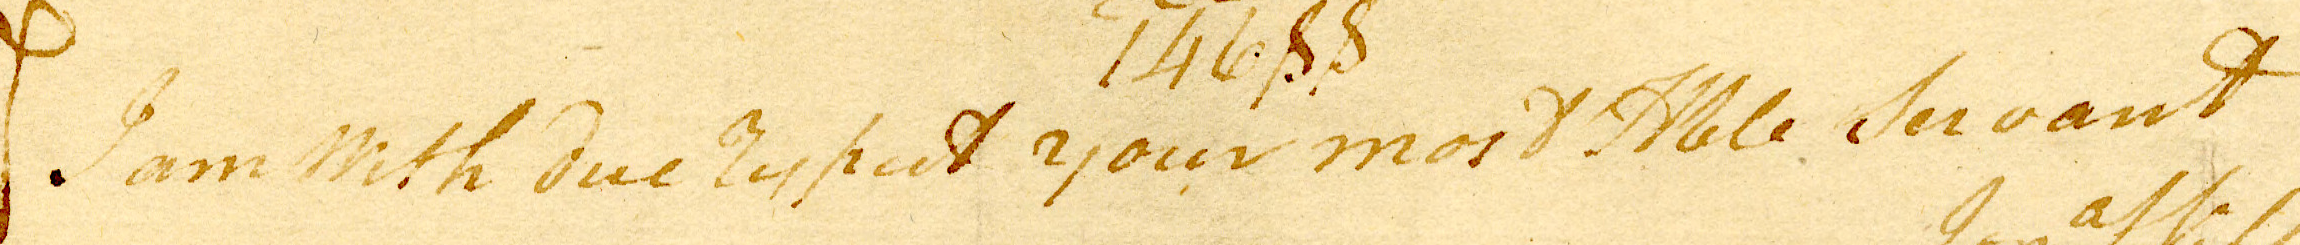I am with due respect your most Hble Servant
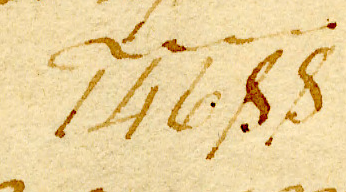14688
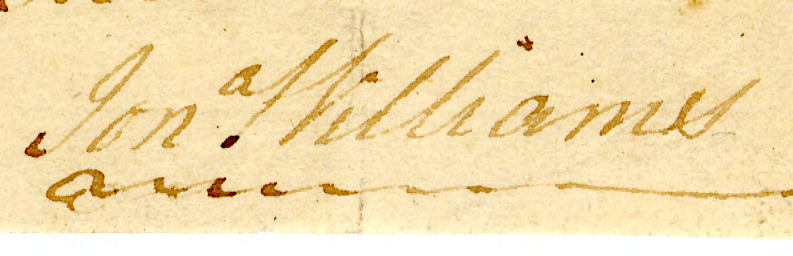Jon^a Williams
